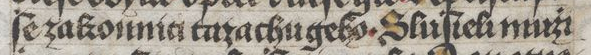ſe zakonnici tazachu geho.Sluẛieli mużi
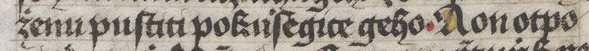żenu puſtiti pokuẛegíce geho. A on otpo¬
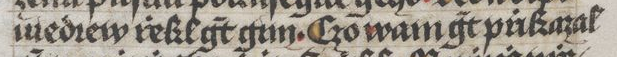uiediew ṙekl ḡt gím.Czo wam ḡt pṙikazal
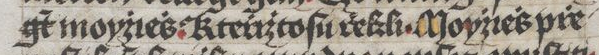ḡt moyżíeṡ?Kteṙíżto ſu ṙekli.Moyżíeṡ pṙe¬
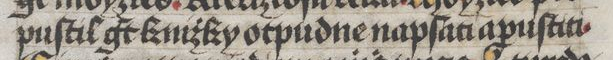puſtil ḡt knížky otpudne napſati a puſtiti.
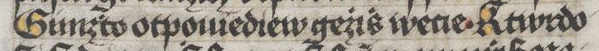Gimžto otpouiediew geżíṡ wecie.K twrdo¬
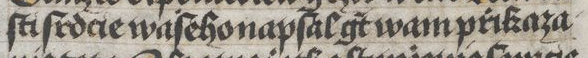ſti ſrdcie waẛeho napſal ḡt wam pṙikaza¬
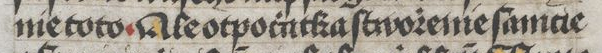níe toto.Ale otpoċatka ſtwoṙeníe ſamcie
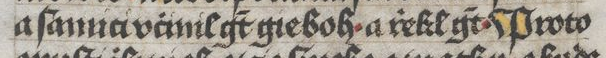a ſamiti vċinil ḡt gíe boh.a ṙekl ḡt.Proto
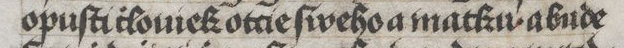opuſtí ċlouiek otcíe ſweho a matku.a bude
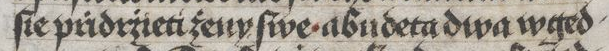ſie pṙidrżieti żeny ſwe.a budeta dwa wged¬
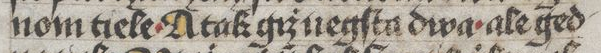nom tiele. A tak giž negſta dwa.ale ged¬
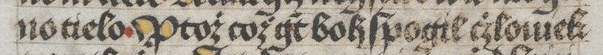no tielo.Ꝓtož coż ḡt boh ſpogil cżlouiek
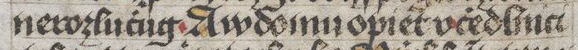nerozluċug.A w domu opiet vċedlnici
